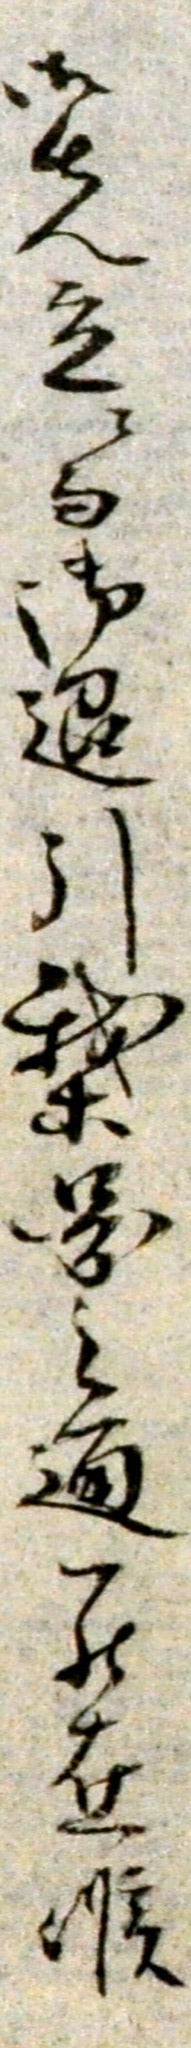御先立ニ而御退引我等圖之通罷在候
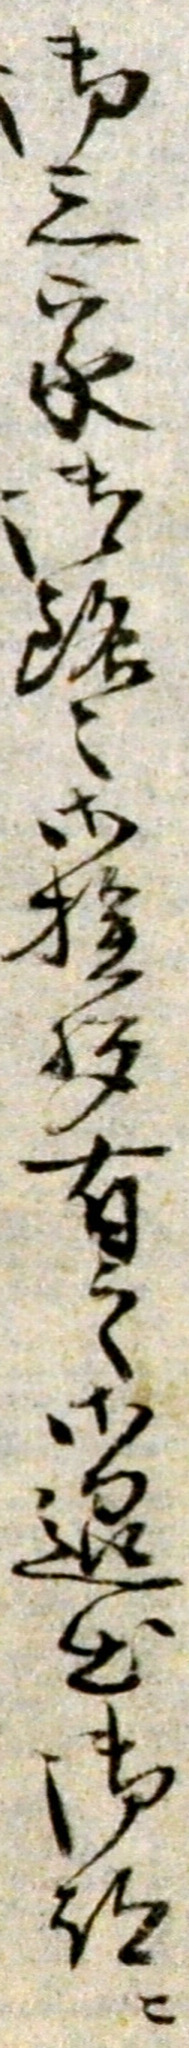御三家御銘々御挨拶有之御退出御跡ニ
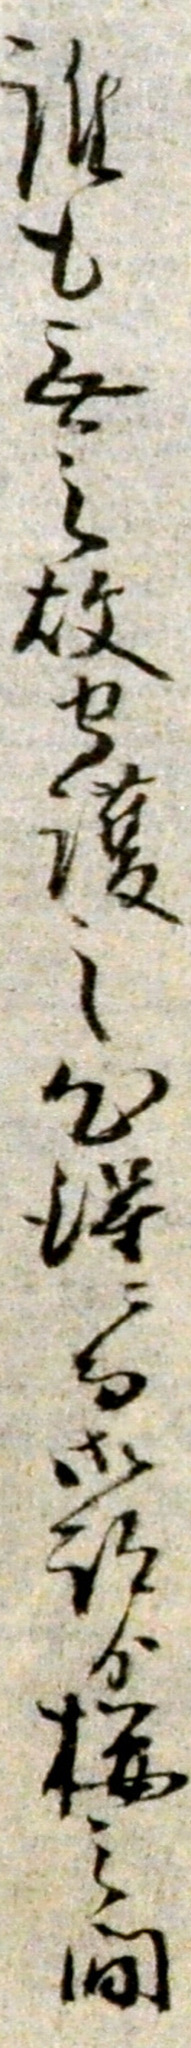誰も無之故守護之心得ニ而御跡ゟ桜之間
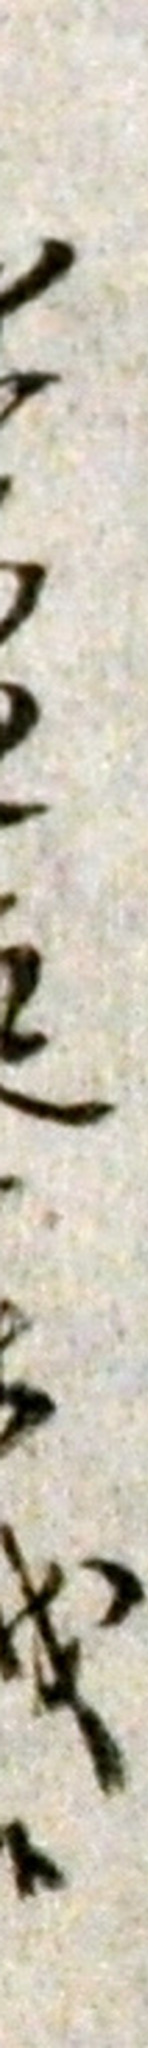近辺迄罷越候

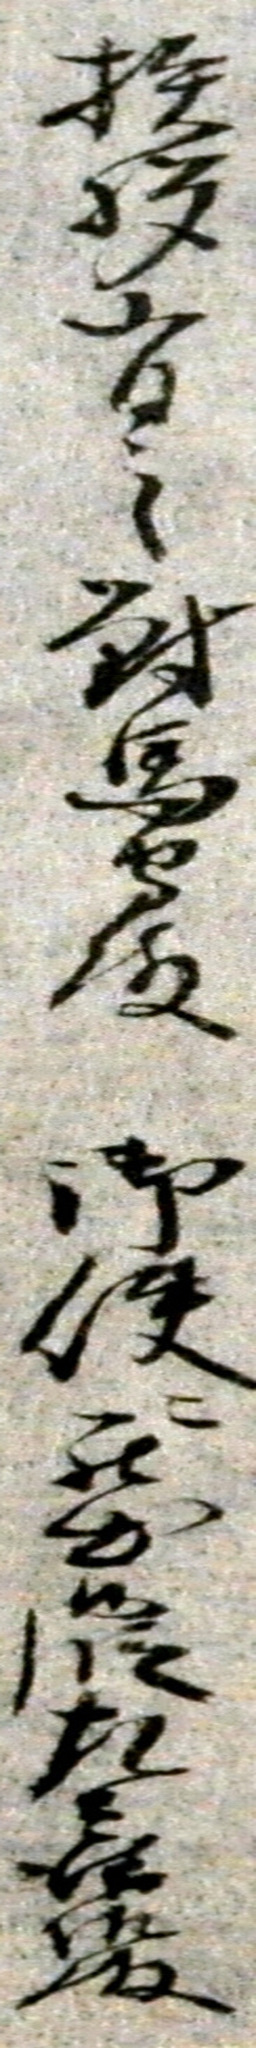挨拶有之對島守殿御使ニ罷出候段左兵衛佐殿
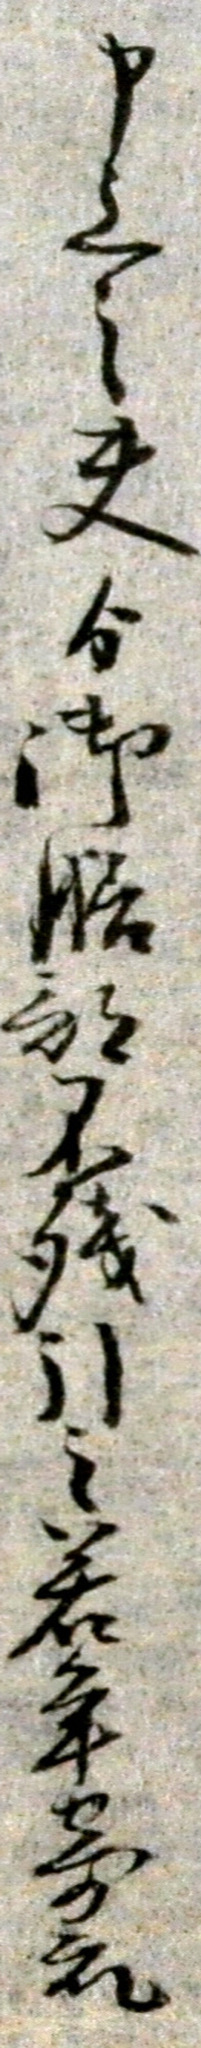申上候夫ゟ御膳部不残引之若年寄衆
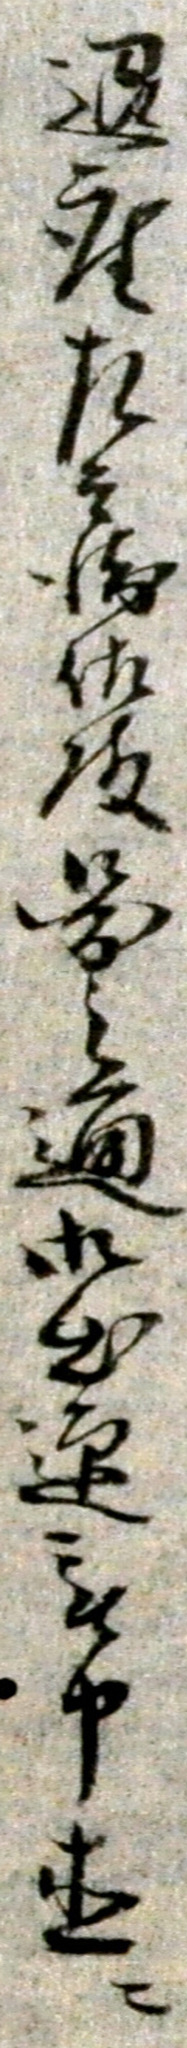退座左兵衛佐殿圖之通御出迎被申直ニ
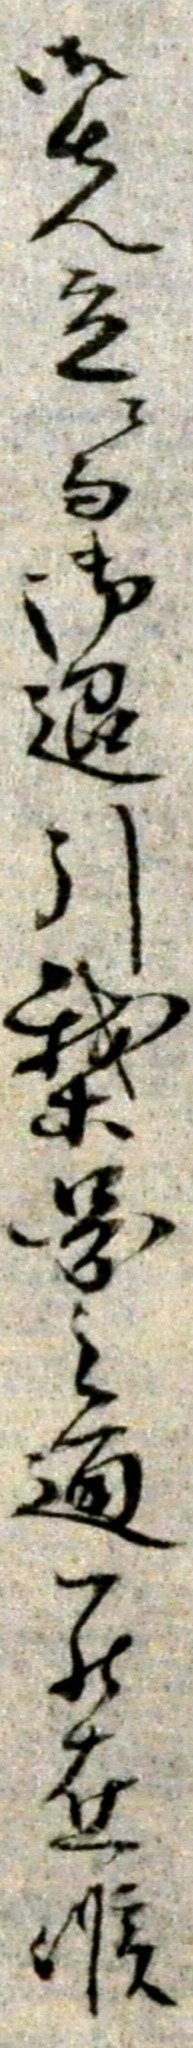御先立ニ而御退引我等圖之通罷在候
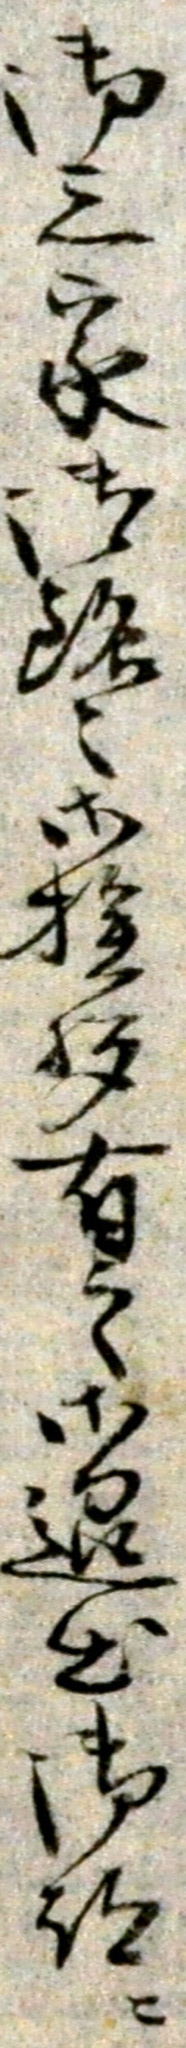御三家御銘々御挨拶有之御退出御跡ニ
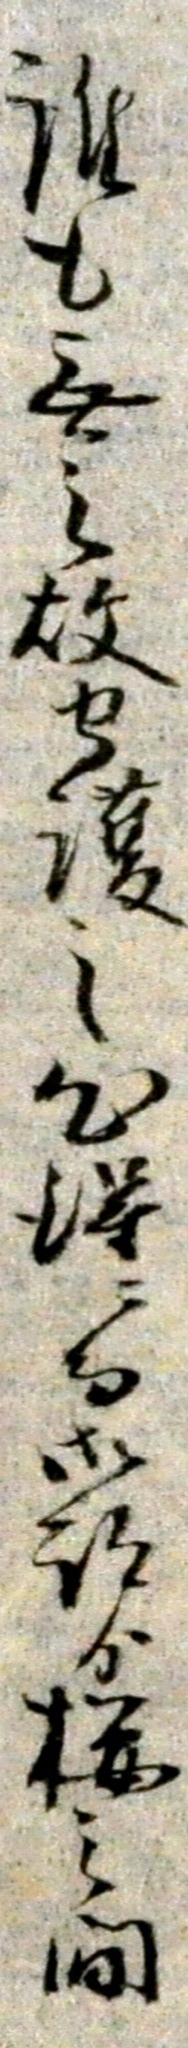誰も無之故守護之心得ニ而御跡ゟ桜之間
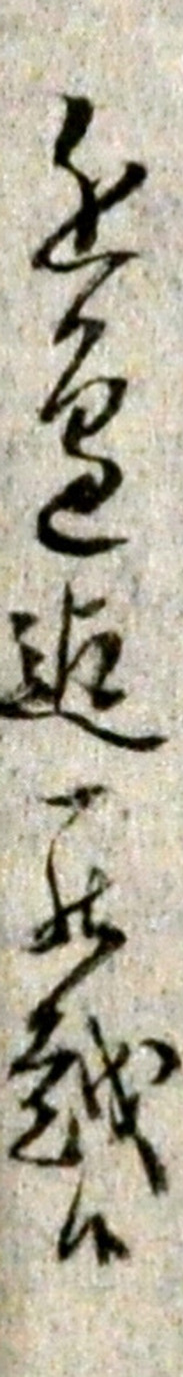近辺迄罷越候
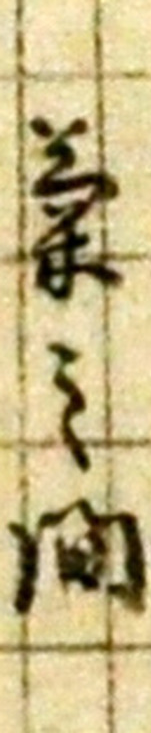菊之間
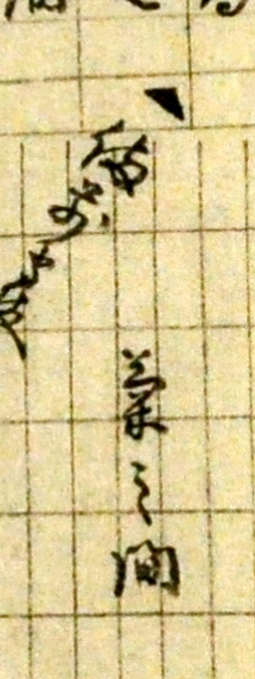菊之間
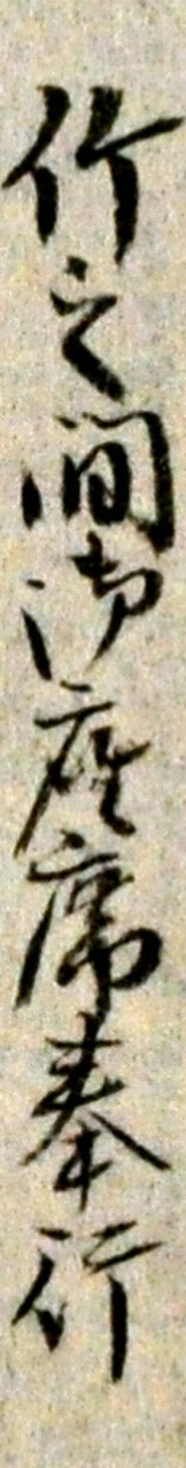竹之間御座席奉行
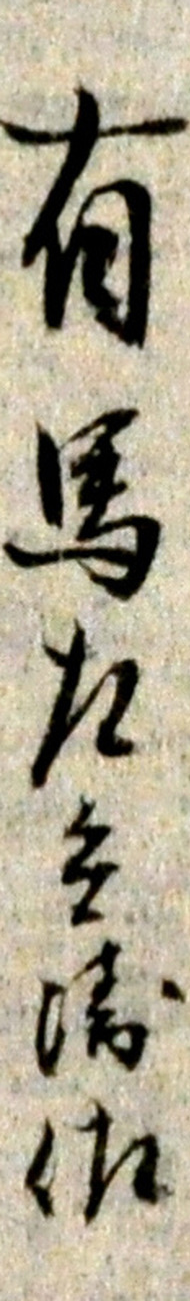有馬左兵衛佐
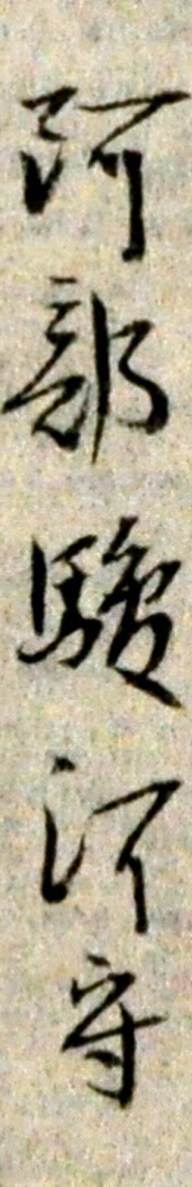阿部駿河守
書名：竹ノ間御座席奉行勤方控外
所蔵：伊那市立高遠町図書館・合同会社AMANE
